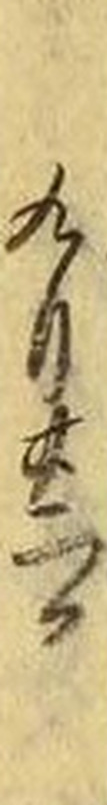九月廿二日
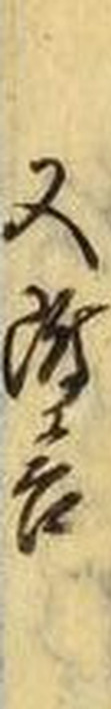又附言
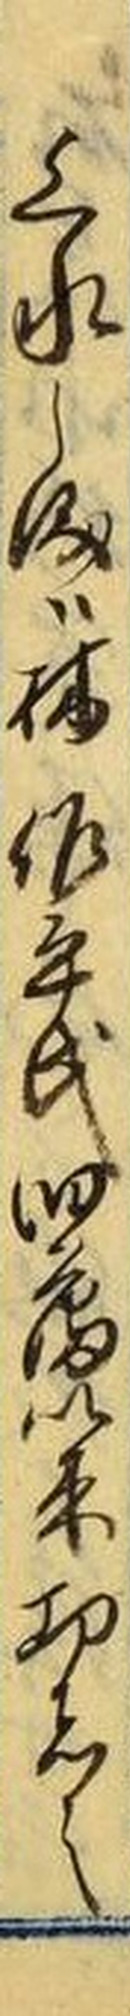上水之儀は林作平氏旧藩以来功者之

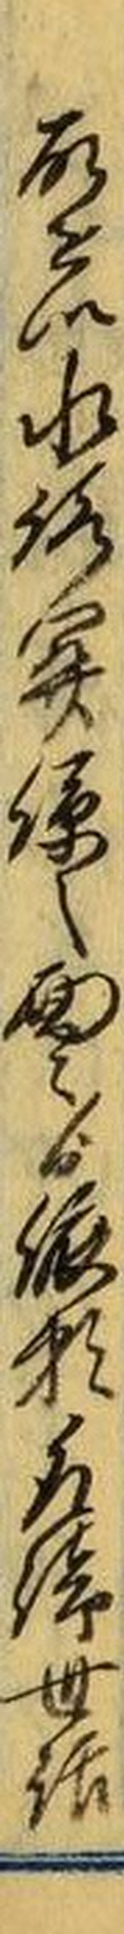故を以水路関係之面々ゟ依頼取締世話
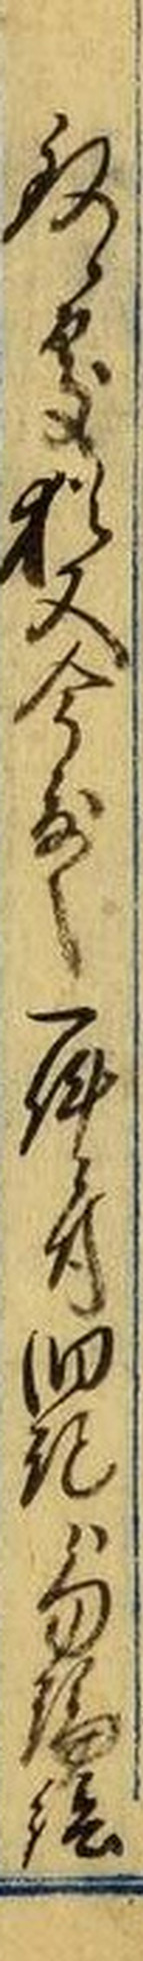致候処猶又今度之一件に付旧記は勿論絵
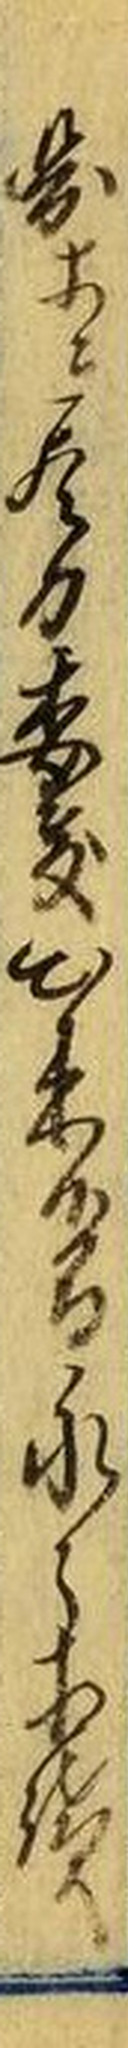図等に尽力委敷出来候間永々相続
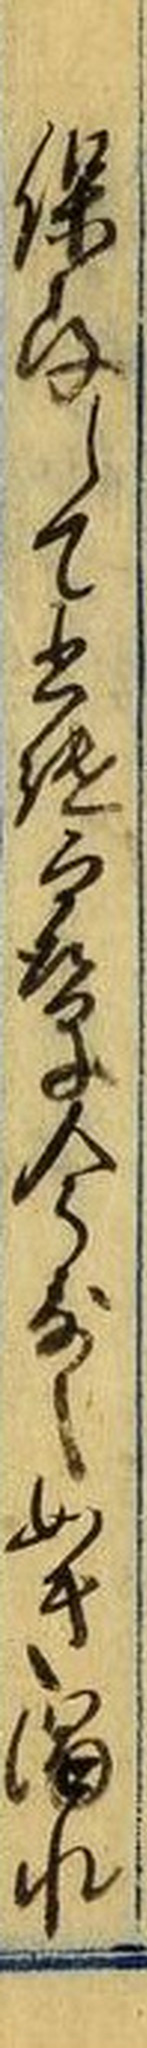保存して書継最早今度之如き渇水
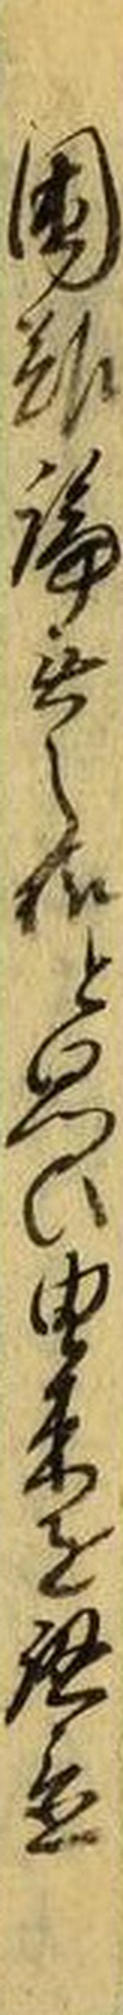困難論無之様と思ひ由来を認置
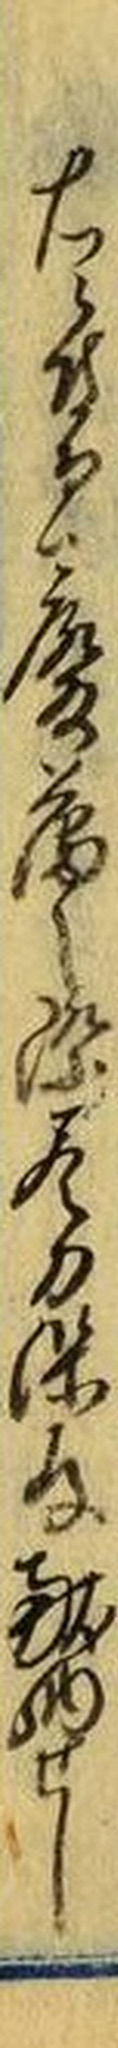右に付而は廃藩之際尽力保存献納せし
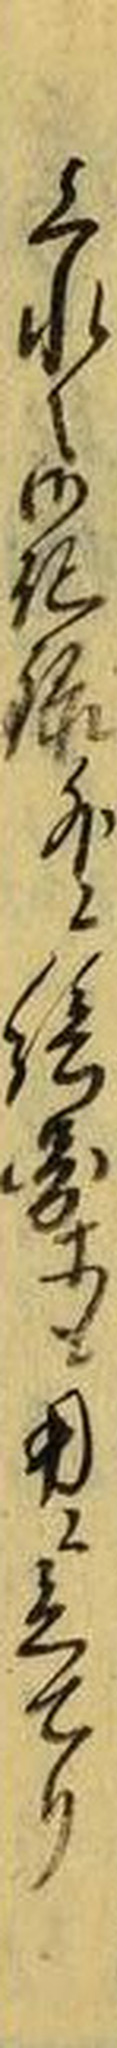上水之御記録外に絵図等も用に立てり
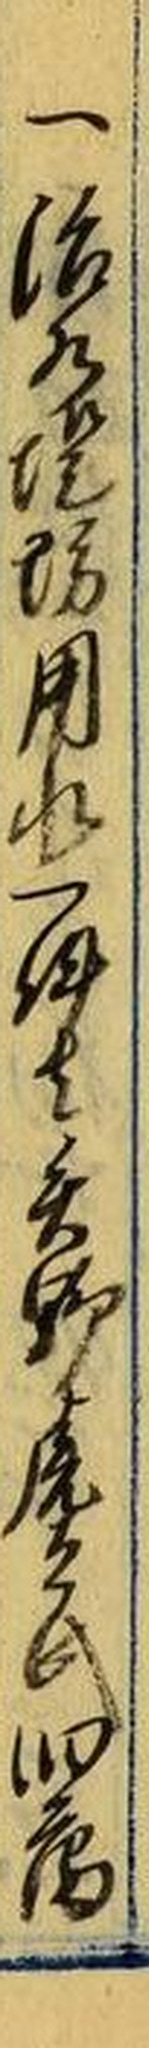一治水堤防用水一件は矢野虎太氏旧藩
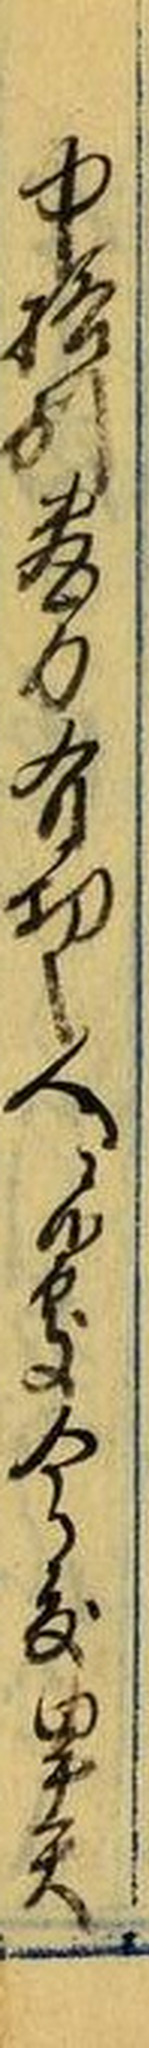中格別尽力有功之人に候処今度旱天
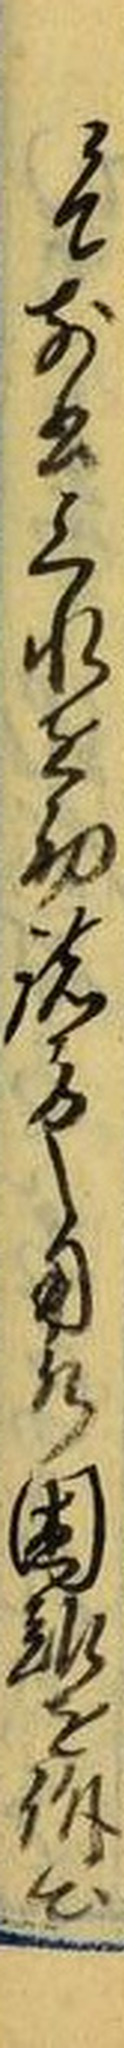にて前書上水を初諸方之用水困難を訴出
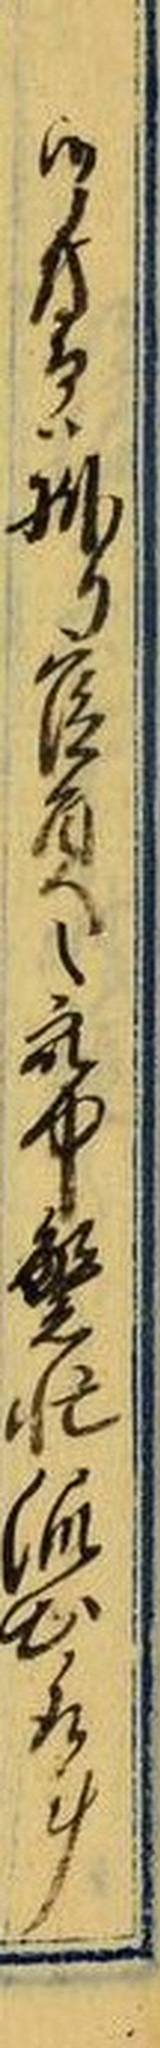候に付而は掛り官員之衆中繁忙流出取計
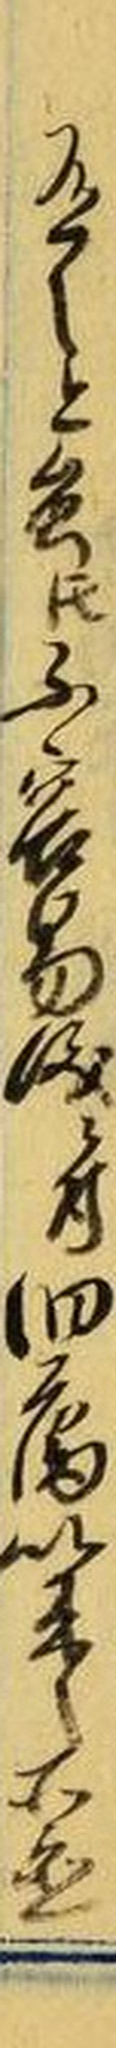有之と雖とも不容易儀に付旧藩以来之所置
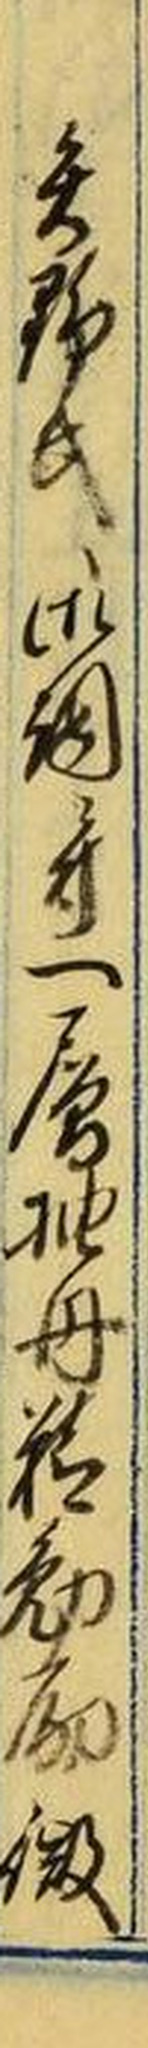矢野氏へ御調に付一層抽丹精勉励微
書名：温古集 五巻
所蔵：福井県文書館 Fukui Prefectural Archives
